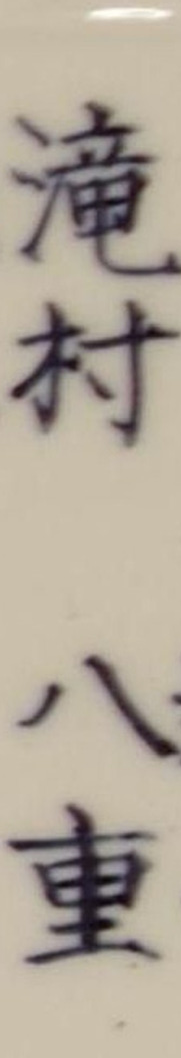滝村八重
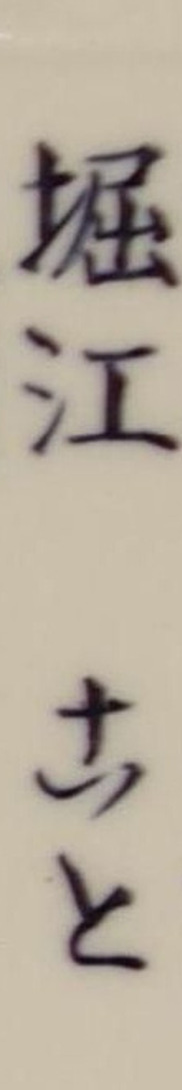堀江こと
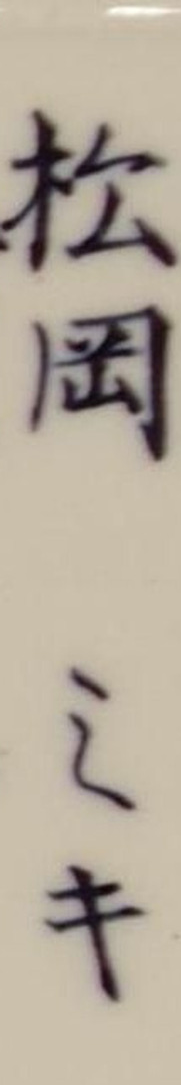松岡ミキ
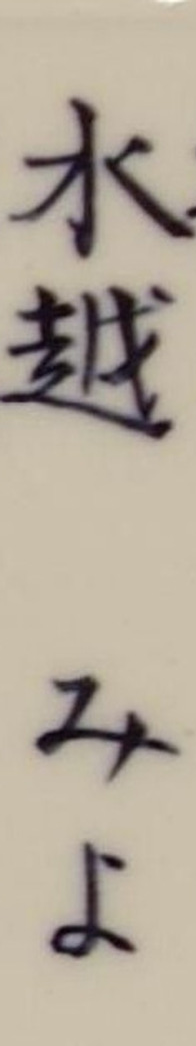水越みよ
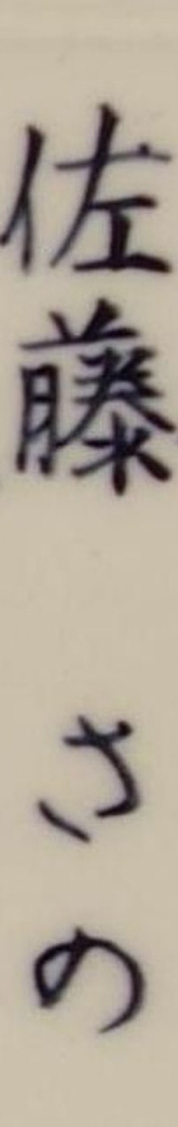佐藤さの
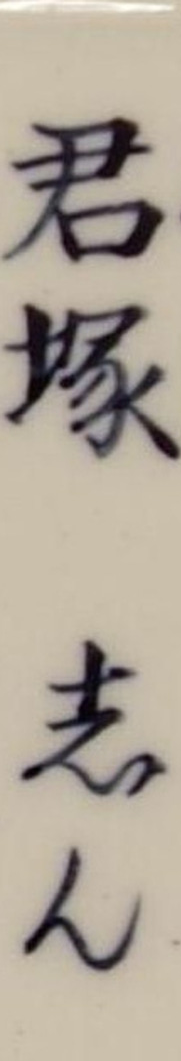君塚しん
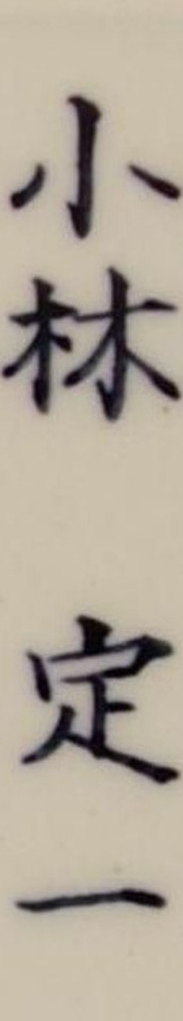小林定一
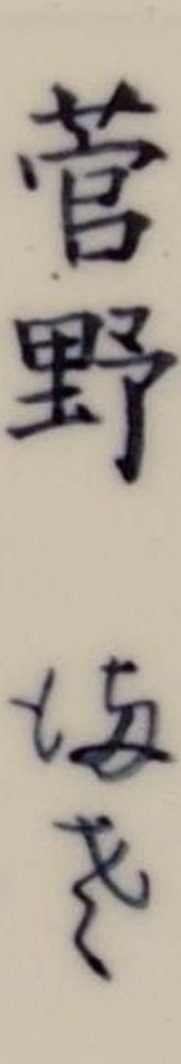菅野まさ
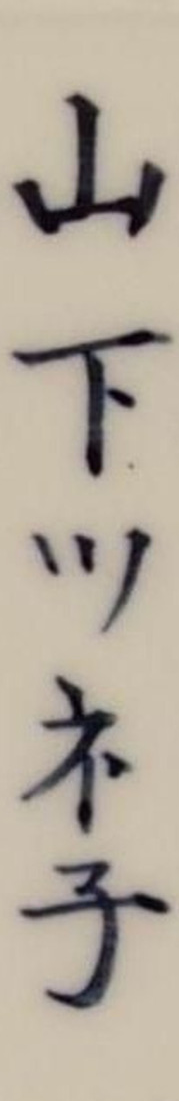山下ツネ子
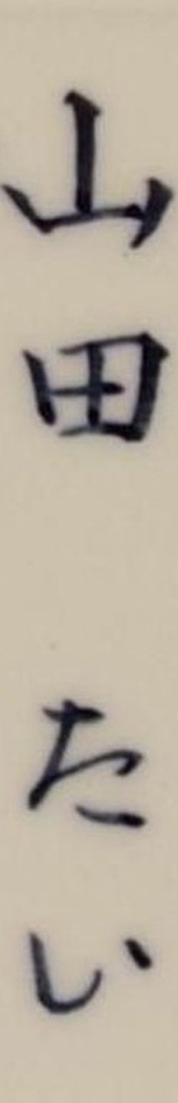山田たい
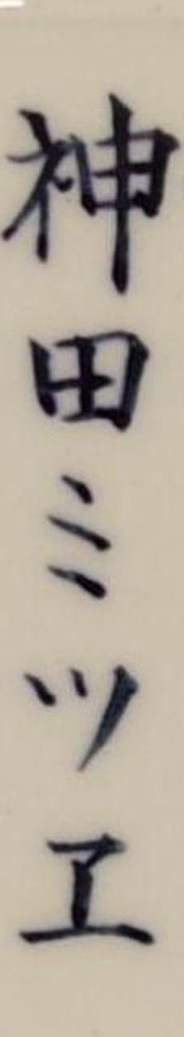神田ミツエ
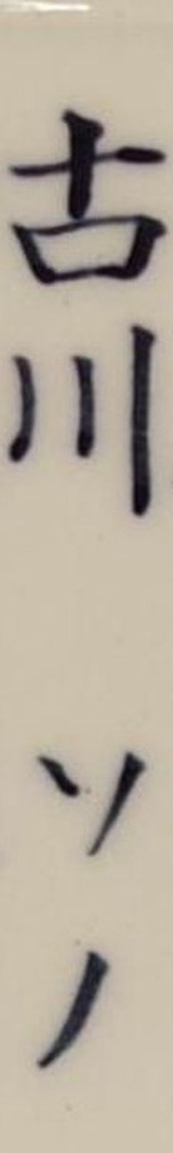古川ソノ
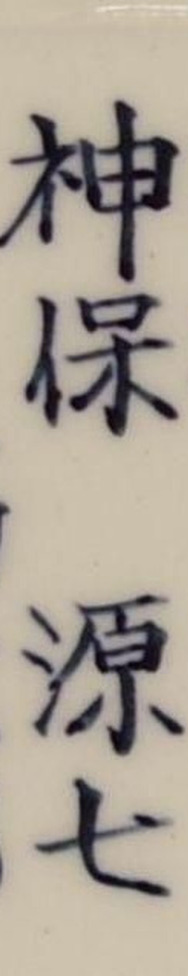神保源七
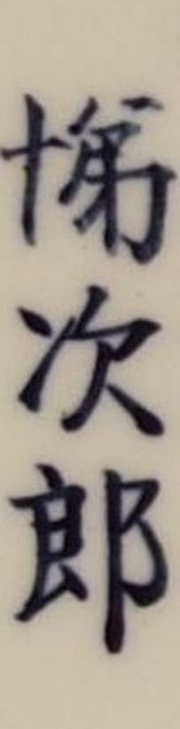悌次郎
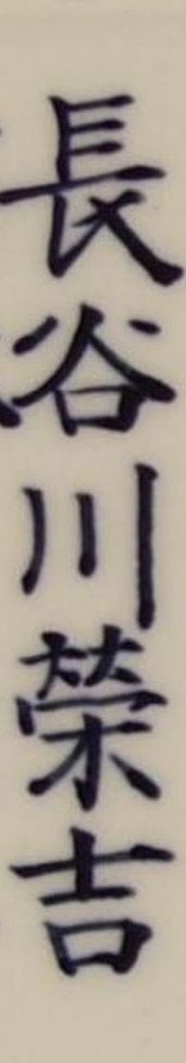長谷川榮吉
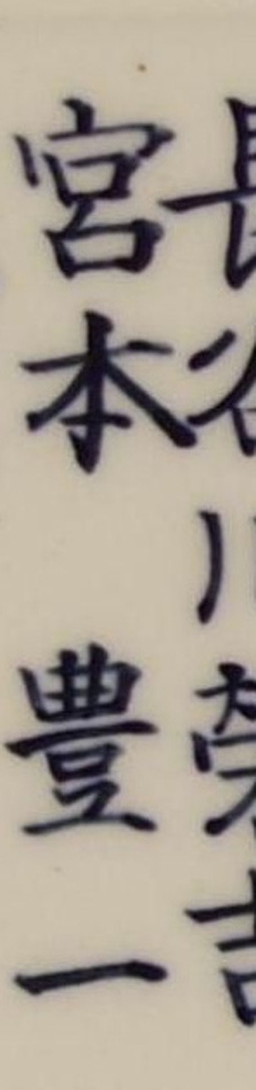宮本豊一
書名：E~L
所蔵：高野山金剛峯寺
